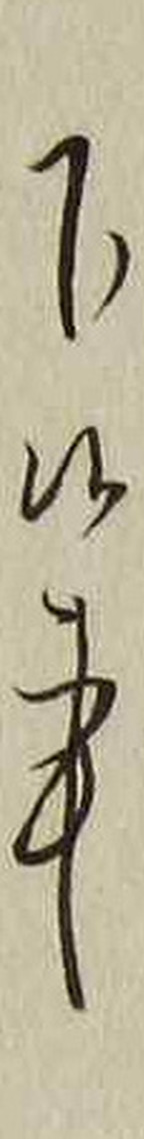下候事
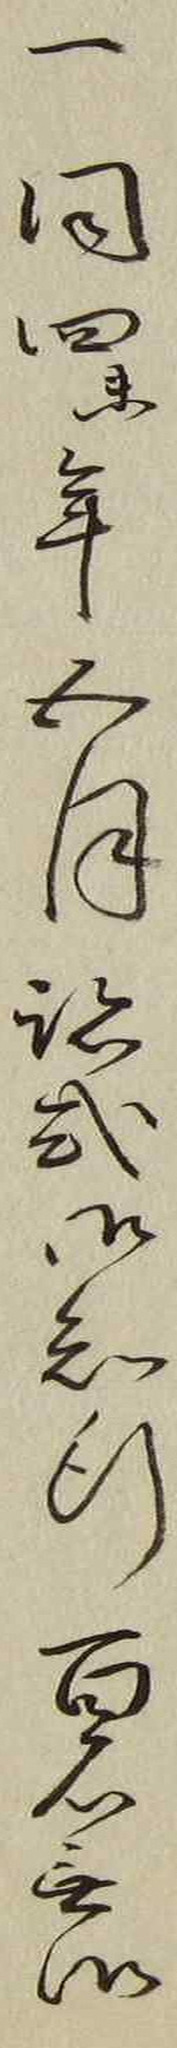一同四未年五月跡式御知行百石無御
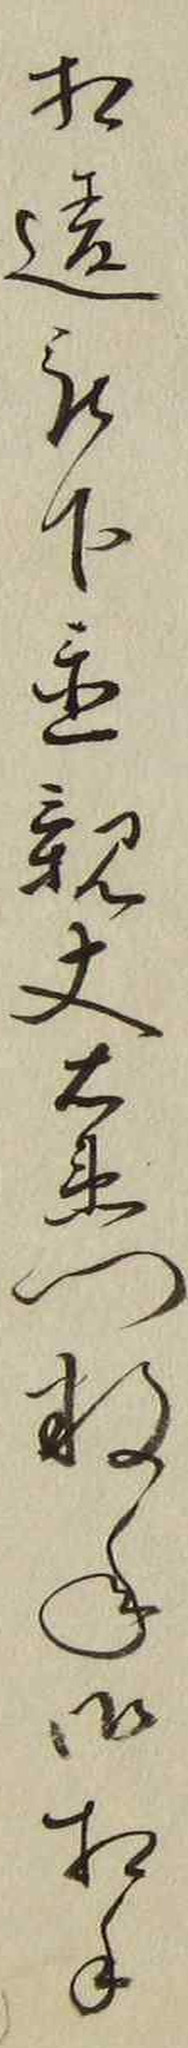相違被下置親丈右衛門数年御相手

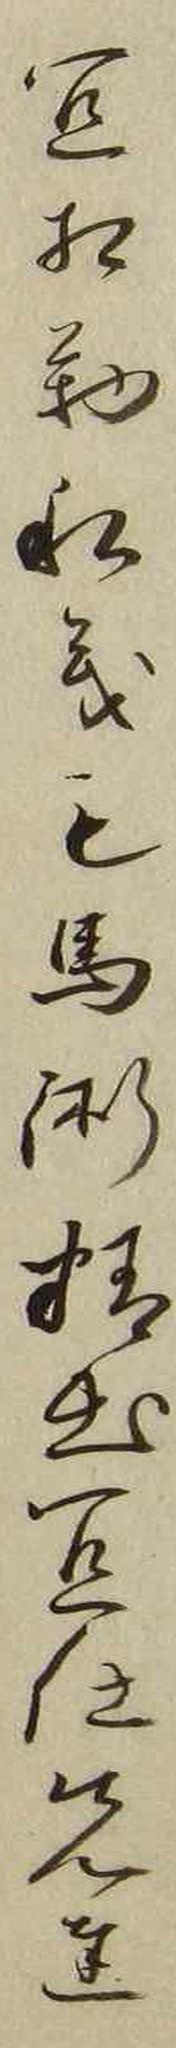宜相勤私義も馬術精出宜仕先達
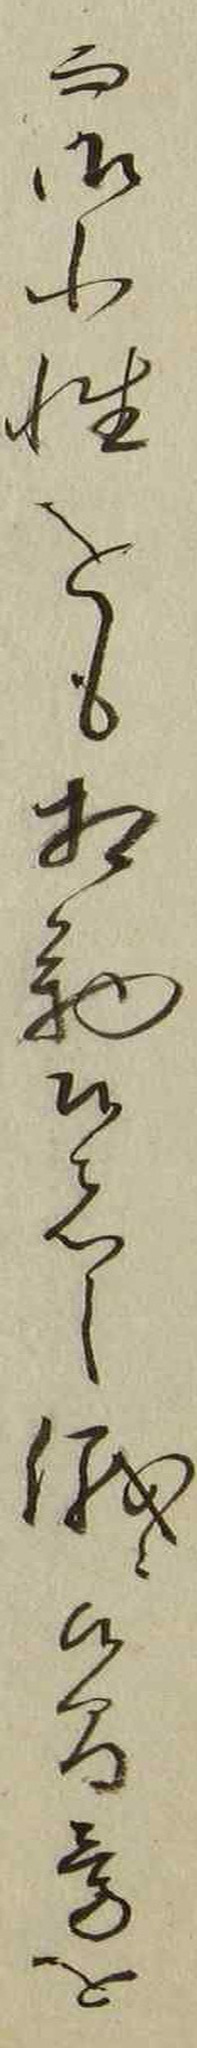而御小性をも相勤候者之儀ニ候間旁を
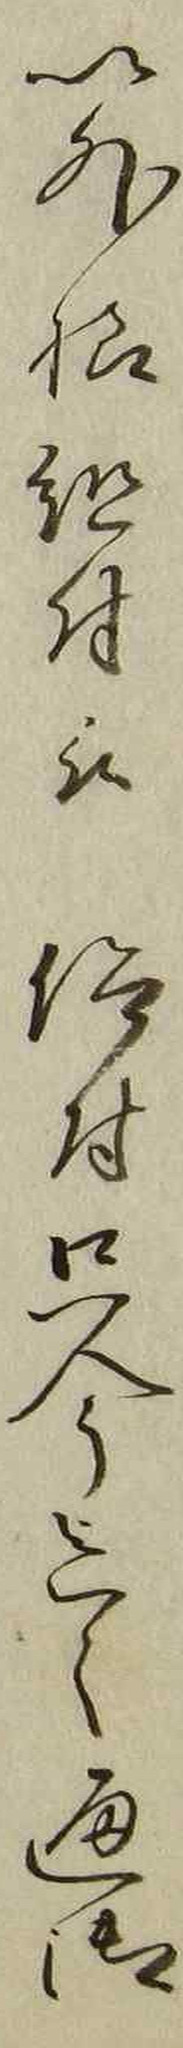以外様組付被仰付只今迄之通御
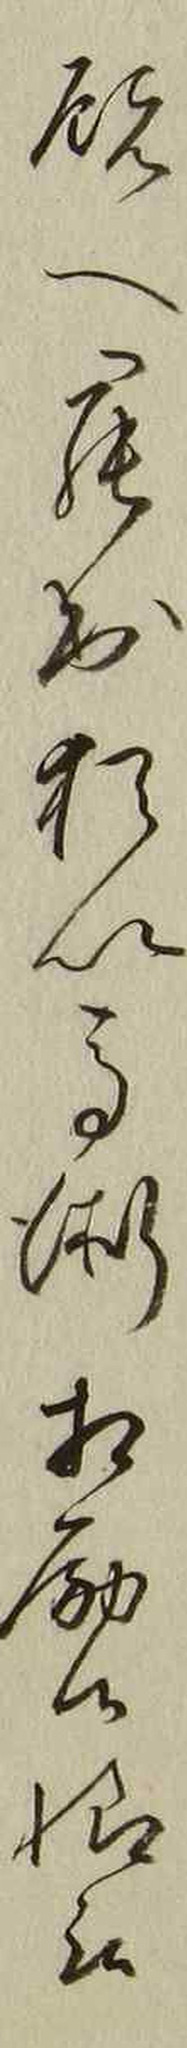厩へ罷出猶以馬術相励候様被
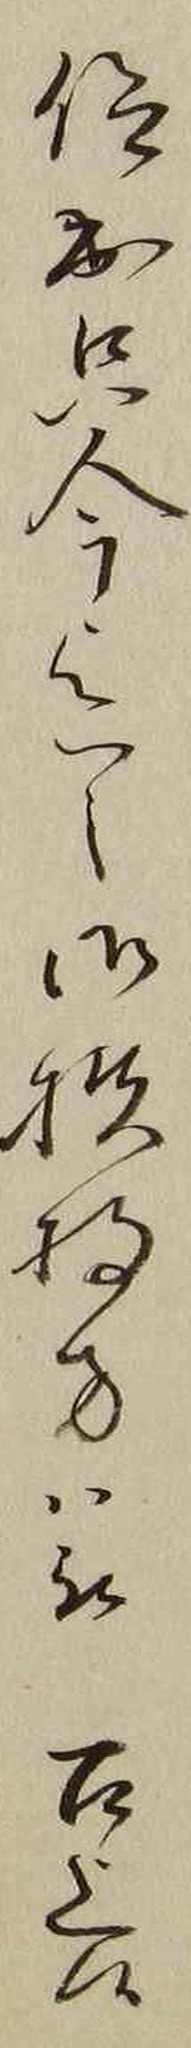仰出只今迄之御扶持方ハ被召上候
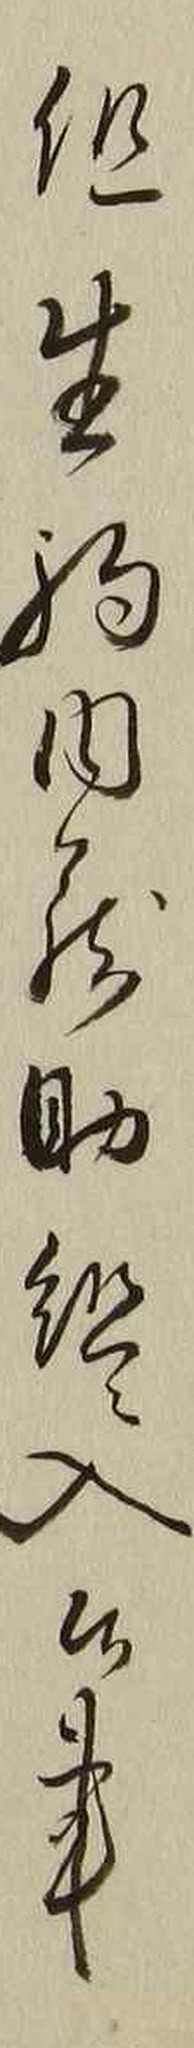但生駒内蔵助組ニ入候事
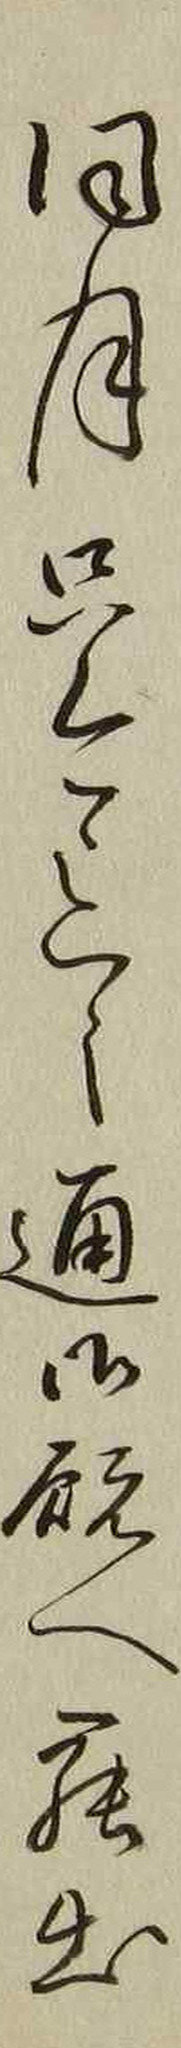一同月只今迄之通御厩へ罷出
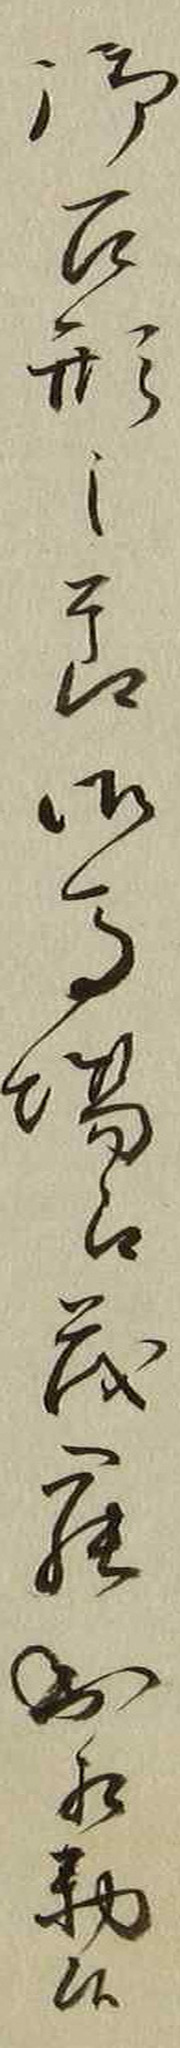御召形之節御馬場えも罷出相勤候
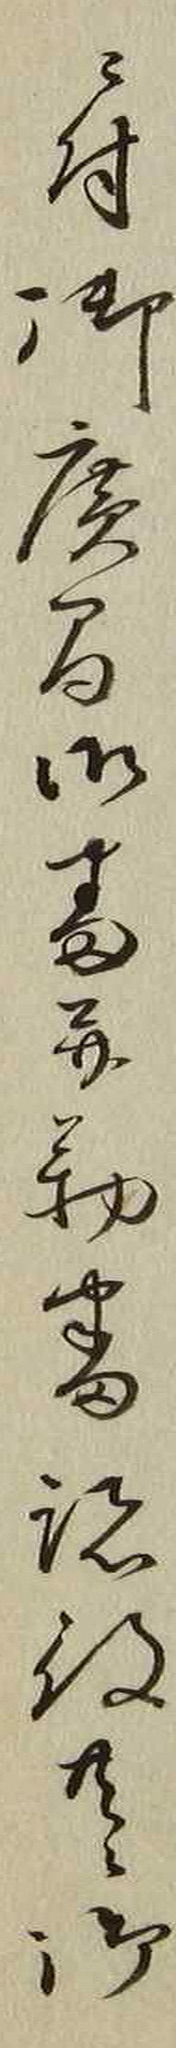ニ付御廣間御番幷勤番諸役共ニ御
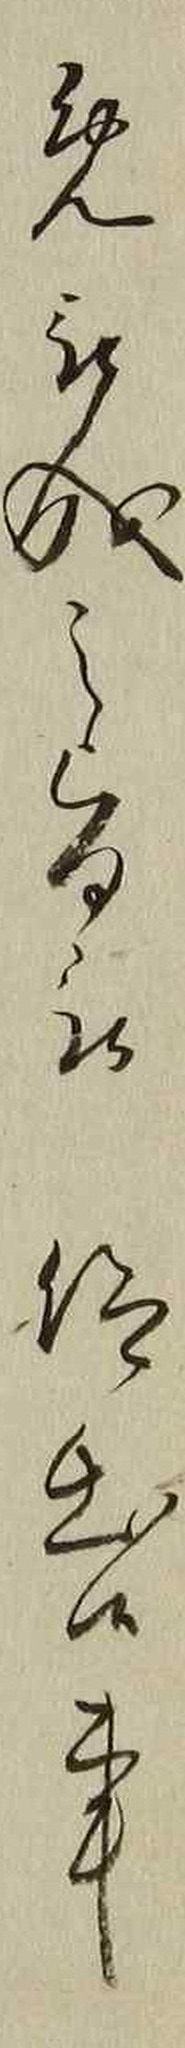免被成之旨被仰出候事
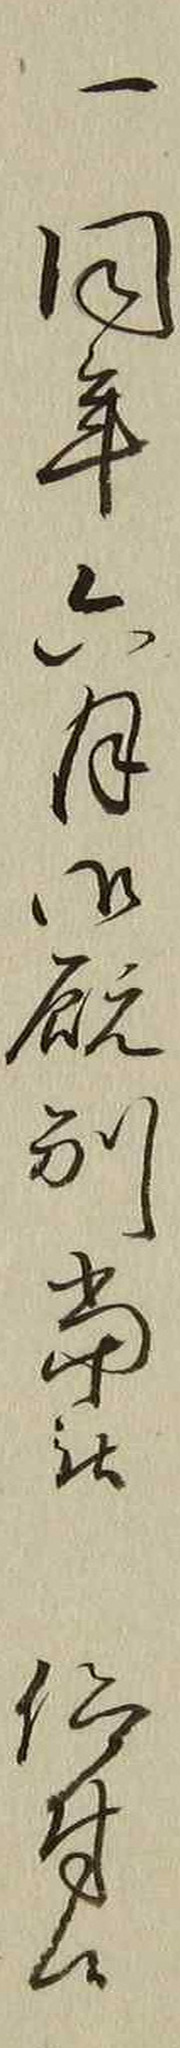一同年六月御厩別当被仰付候
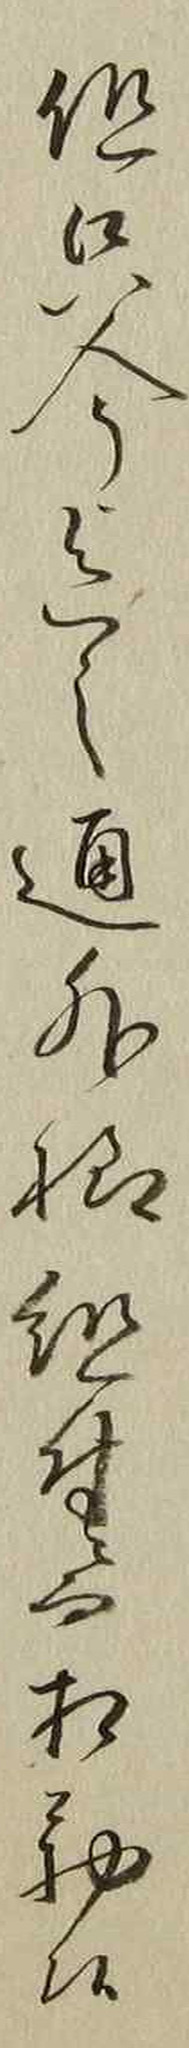但只今迄之通外様組付ニ而相勤候
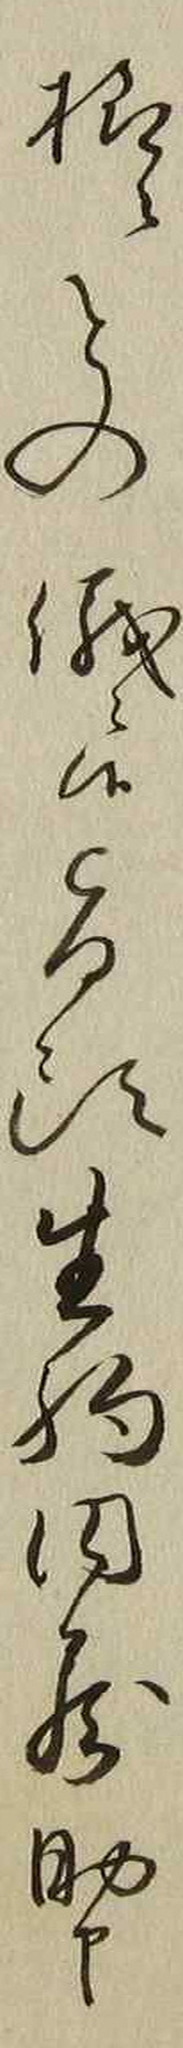様ニとの儀ニ候旨頭生駒内蔵助申
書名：諸士系譜　巻之3　い之部3
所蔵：会津若松市立会津図書館
